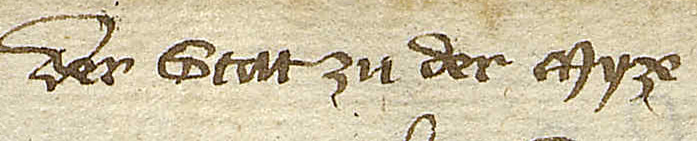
Der Stat cʒu Myʒe
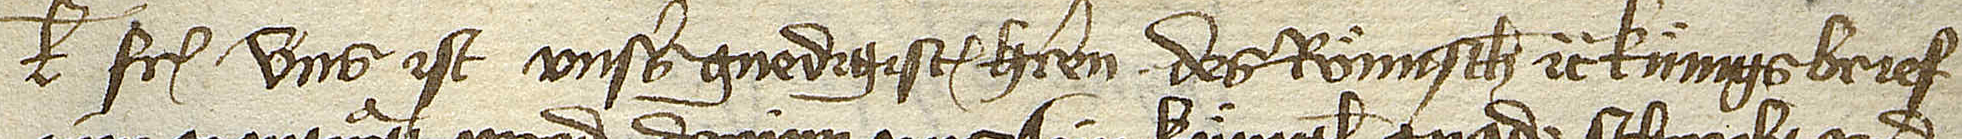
L* fr* / Vns iſt vnſ*s gnedigiſt* hr*en des Römiſch* ec* künigs brief
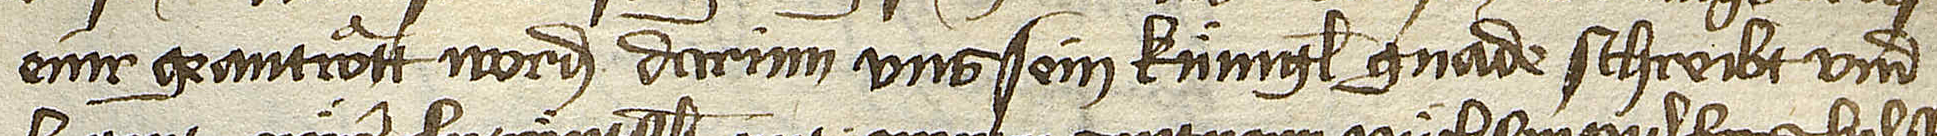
einr geantw*tt word* darinn vns ſein künigl* gnade ſchreibt vnd
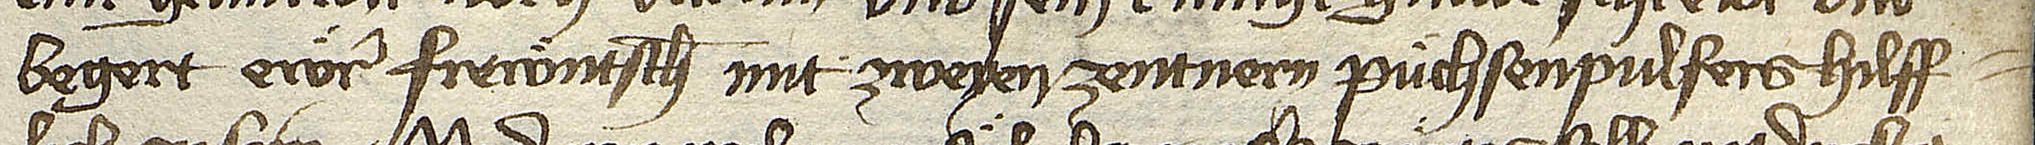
begert eẅr* freẅntſch* mit ʒweyen ʒentnern püchſenpulfers hilff =
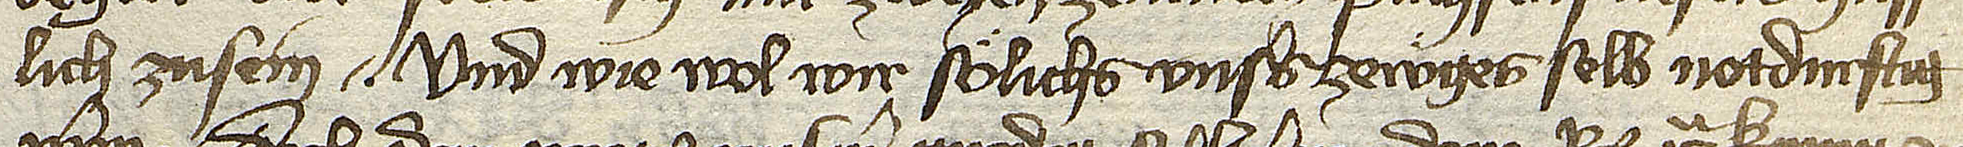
lich ʒuſein / Vnd wie wol wir ſölichs vnſ*s ʒeẅges ſelb notdurftig
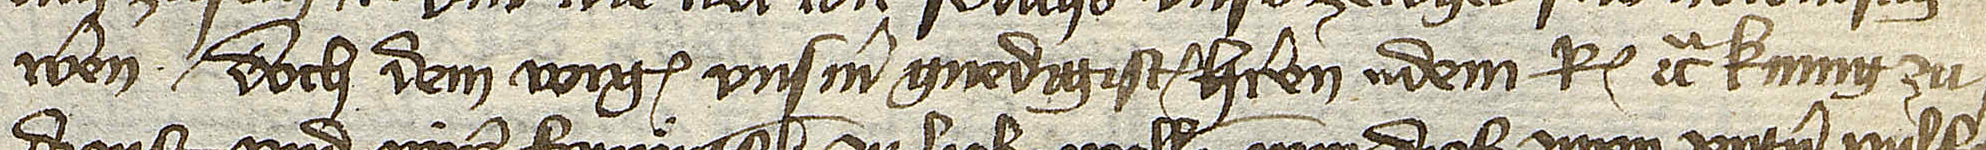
we*n / Doch dem vorg* vnſm* gnedigiſt* hr*en ~ dem R* ec* kunig ʒu
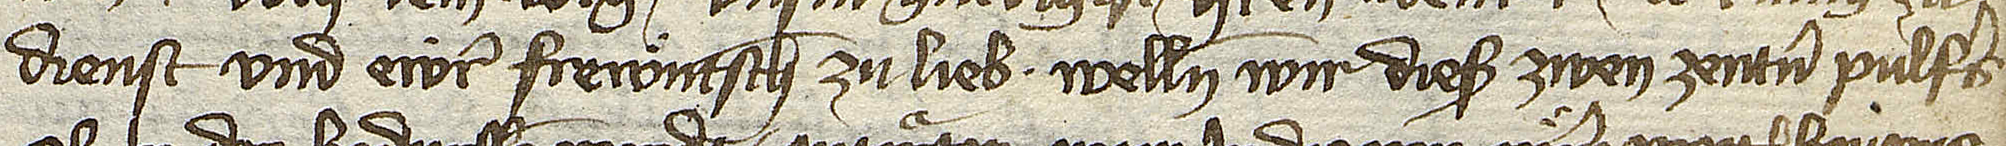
dienſt vnd eẅr* freẅntſch* ʒu lieb welln* wir dieſ* ʒwen ʒentn* pulf*s
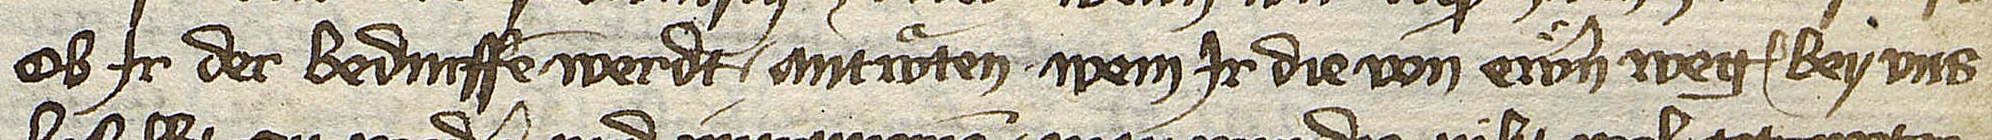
Ob Ir der bedurffe* werdt / antwten* wem Ir die von eẅn* weg* bey vns
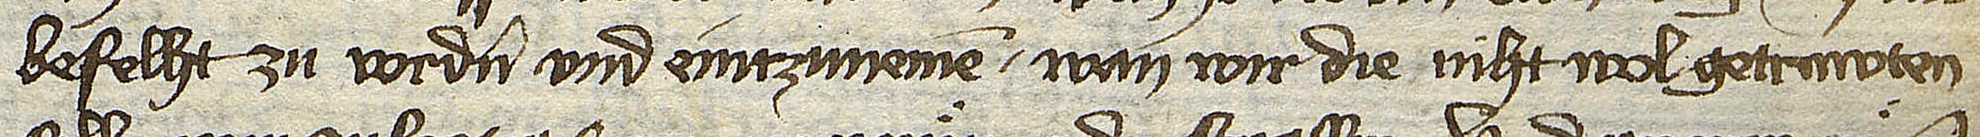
befelht ʒu vordn* vnd eincʒuneme* / wan wir doe niht wol getrawten
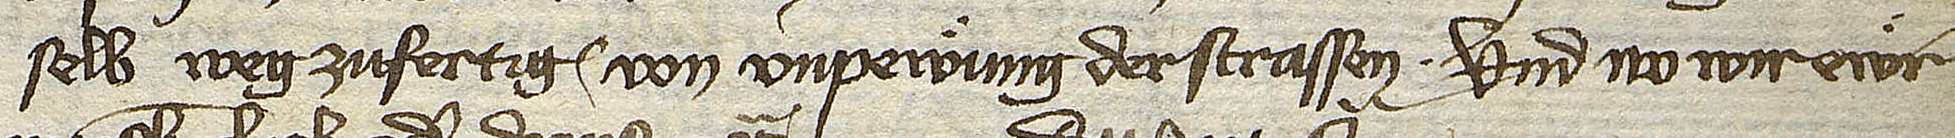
ſelb weg ʒufertig* von vnpeẅung der ſtraſſen . Vnd wo wir eẅr*
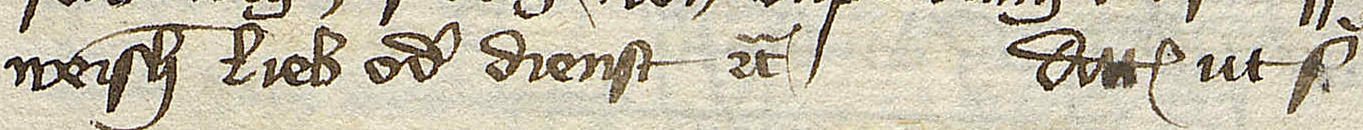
weiſh* lieb od* dienſt ec* Dat* ut ſ*
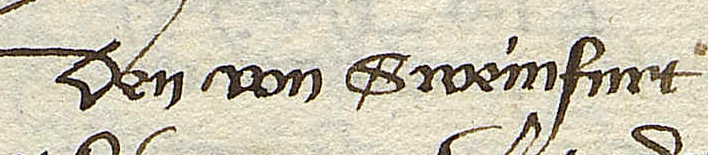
Den von Sweinfurt
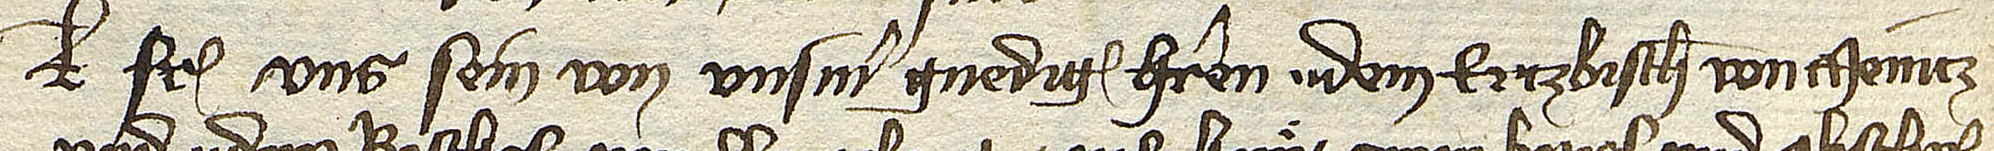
L* fr* vns ſein von vnſm* gnedig* hr*en ~ dem Ercʒbiſch* von Meincʒ
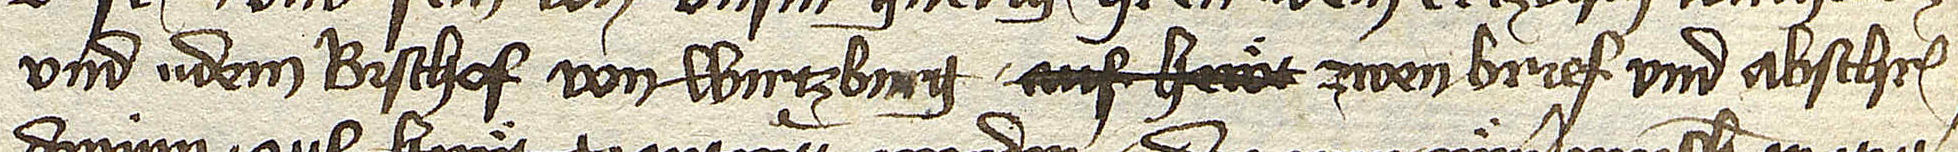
vnd ~ dem Biſchof von wircʒburg / auf heẅt ʒwen brief vnd abſchr*
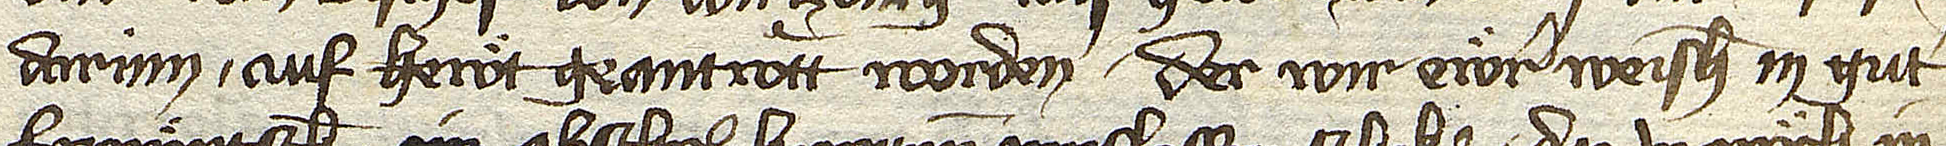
darinn / auf heẅt geantwtt* worden / Der wir eẅr weiſh* in gut*
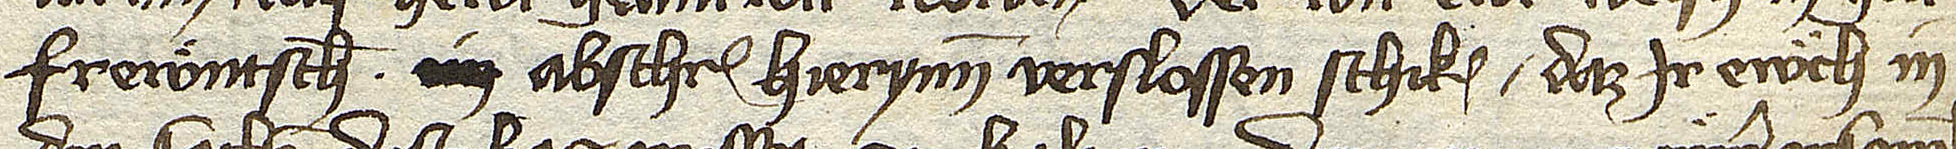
freẅntſch* . ein abſchr* hierynn* verſloſſen ſchik* / daʒ Ir eẅch in
